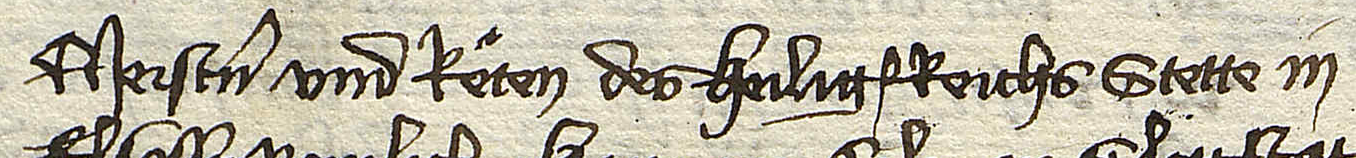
Meiſt*n vnd Rëten des Heilig* Reichs Stette in
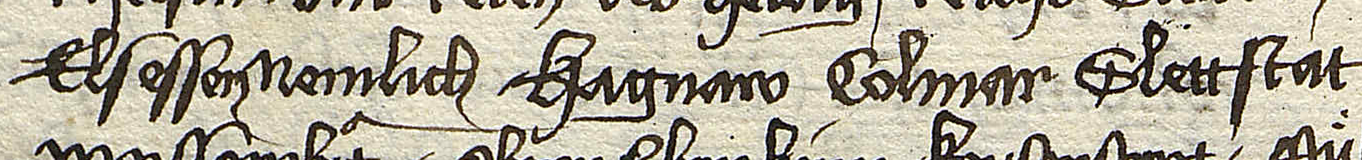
Elſeſſen Nemlich Hagnaw Colmar Slettſtat
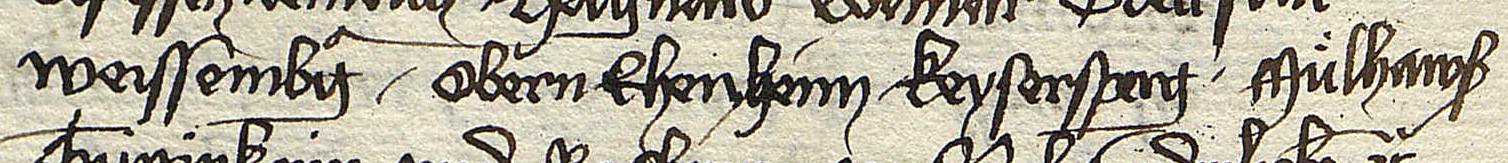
Weiſſenbg* / Obern Ehenheim Keyſerſperg / Mülhawſ*
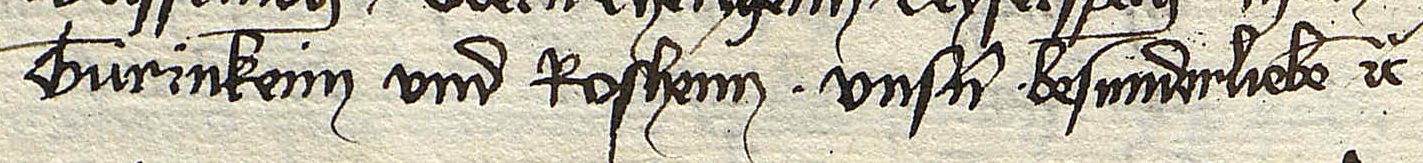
Türinkeim vnd Roſheim . vnſ*n beſunderliebe* ec*
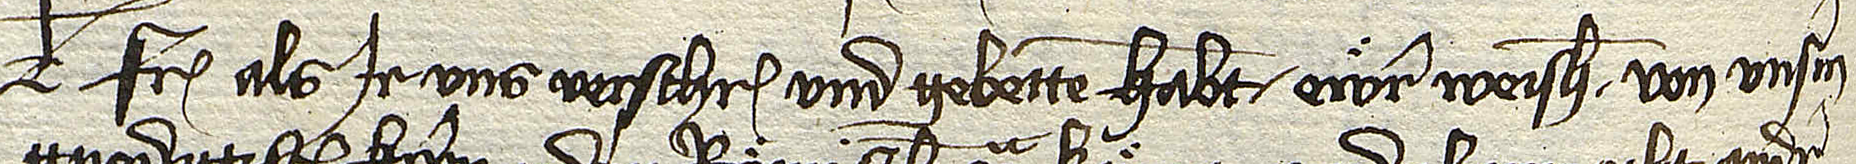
L* fr* als Ir vns verſchr* vnd gebette* habt / eẅr* weiſh* . von vnſ*m
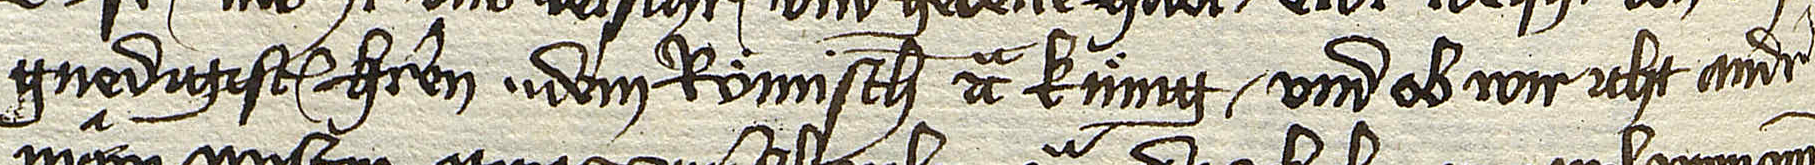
gnedigiſt* h*ren ~ dem Römiſch* ec* künig / vnd ob wir icht and*r
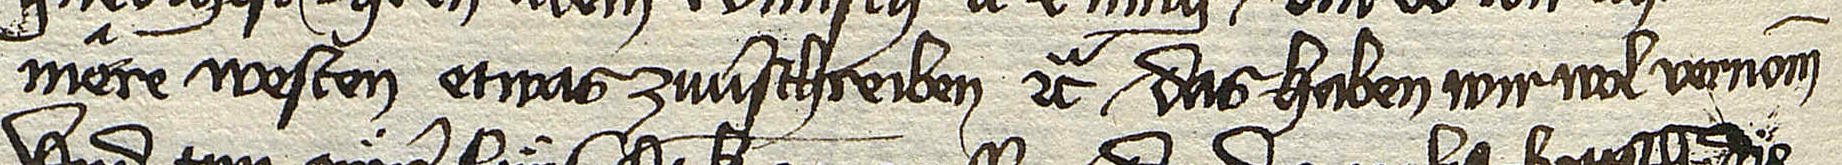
mëre weſten etwas ʒuu*ſchreiben ec* / Das haben wir wol vernom*
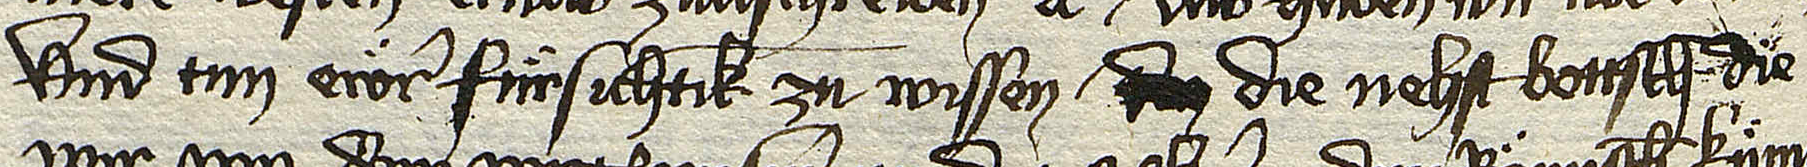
Vnd tun eẅr* fürſichtik* ʒu wiſſen / daʒ die nehſt bottſch* die
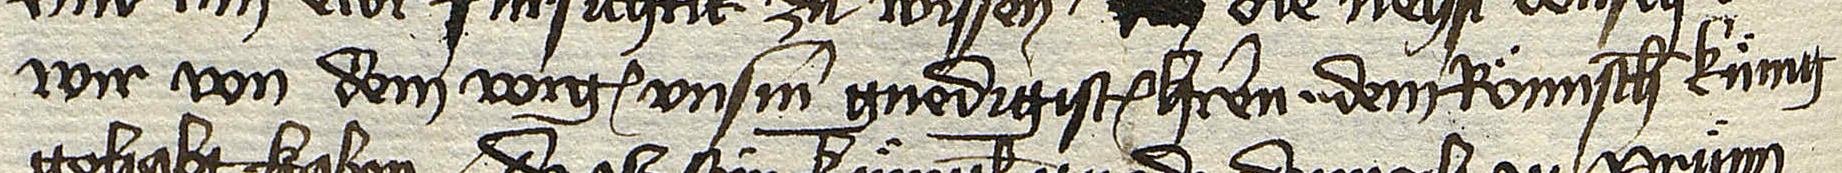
wir von dem vorg* vnſ*m gnedigiſt* h*ren ~ dem Römiſch* künig
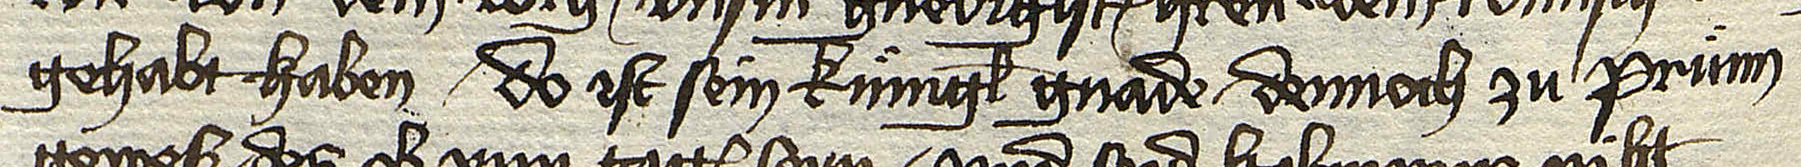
gehabt haben / do iſt ſein künigl* gnade / dennoch ʒu Prünn
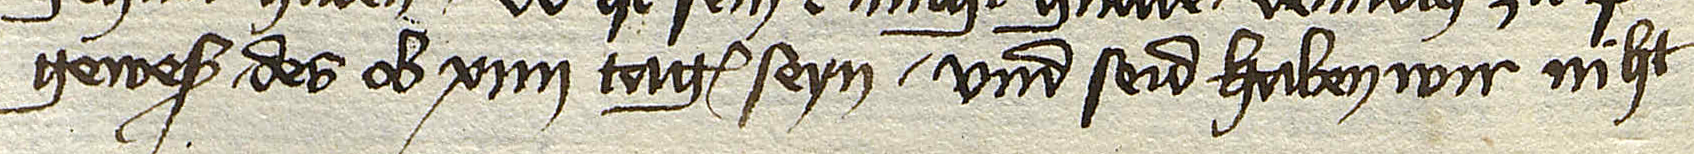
geweſ* / des xiiii tag* ſeyn / vnd ſeid haben wir niht
